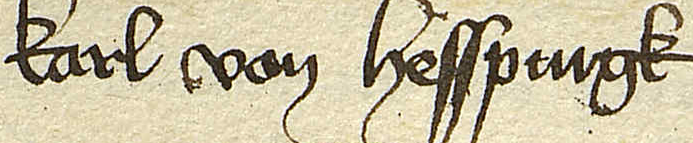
karl von heſſpurgk
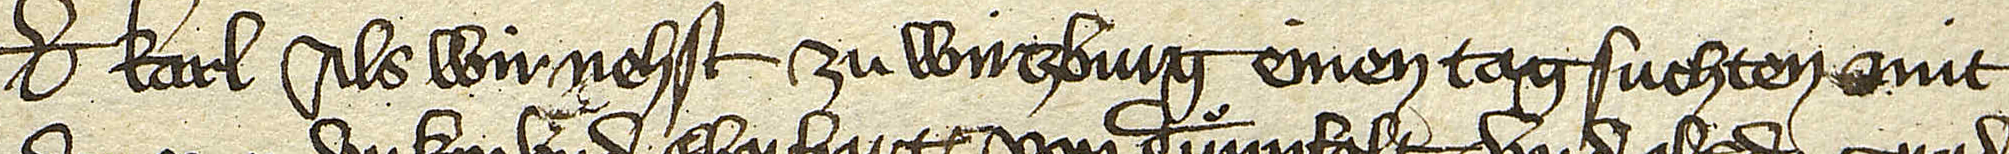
L* karl Als wir neht cʒu wircʒburg einen tag ſuchten mit
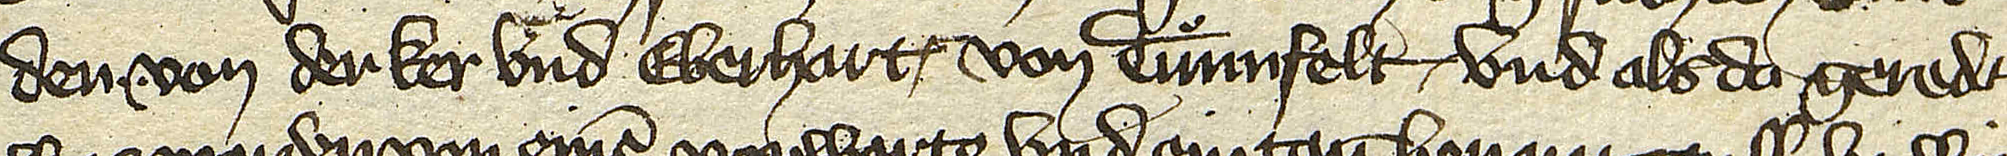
den ~ von der ker vnd Eberhart von Tünnfelt / vnd als da geredt
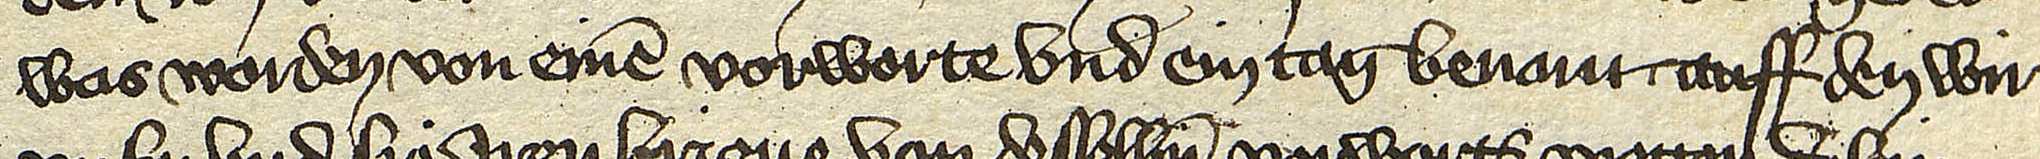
was worden von eine* vorworte vnd ein tag benant / auff den wir
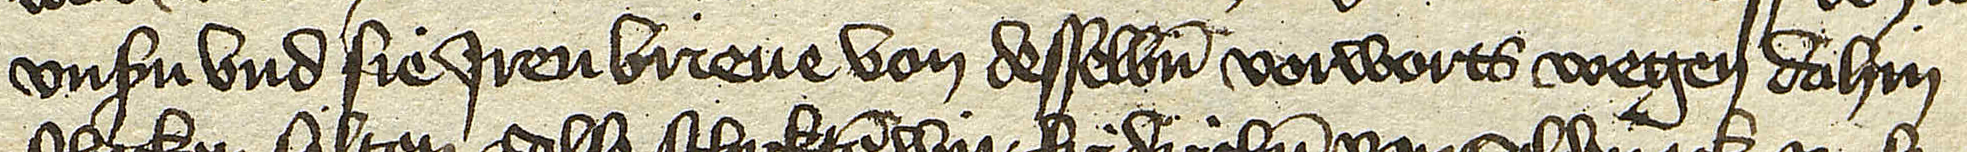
vnſ*n vnd ſie Iren brieue von deſſelbn* vorworts wegen dahin
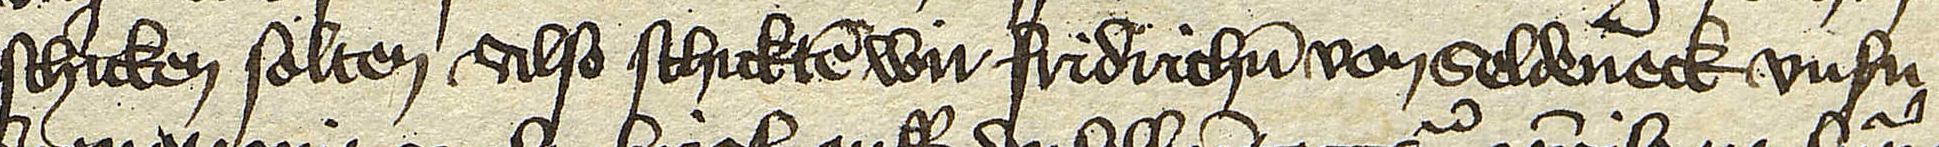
ſchicken ſolten / Alſo ſchicke* wir fridrichn* von Seldeneck vnſ*n
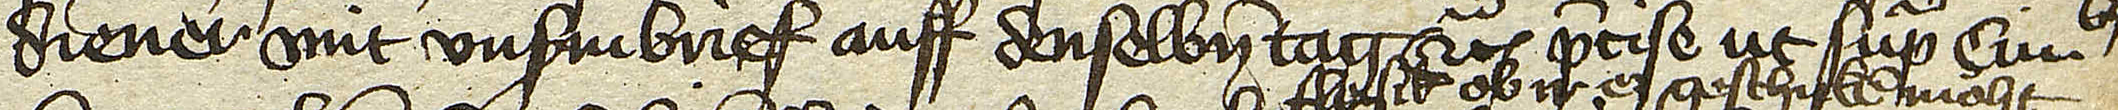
diener mit vnſ*m brief auff denſelbn* tag ec* p*ciſe ut ſup Ciui*
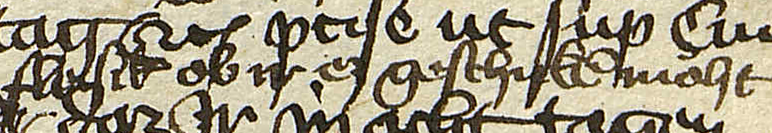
fleiſik* ob it eʒ geſchicke* möht
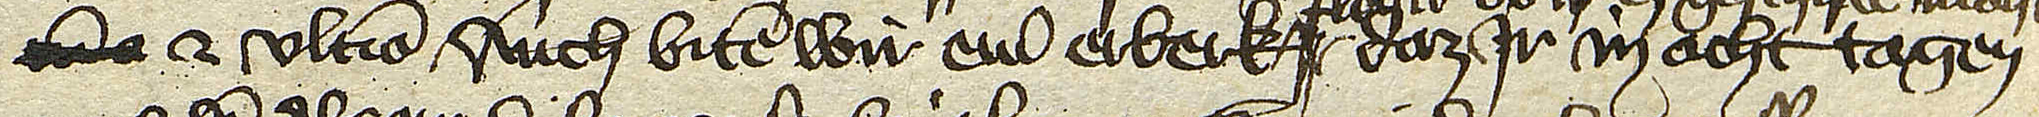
%%*% @ vltio* / Auch bite* wir ew* erberk* daʒ Ir in acht tagen
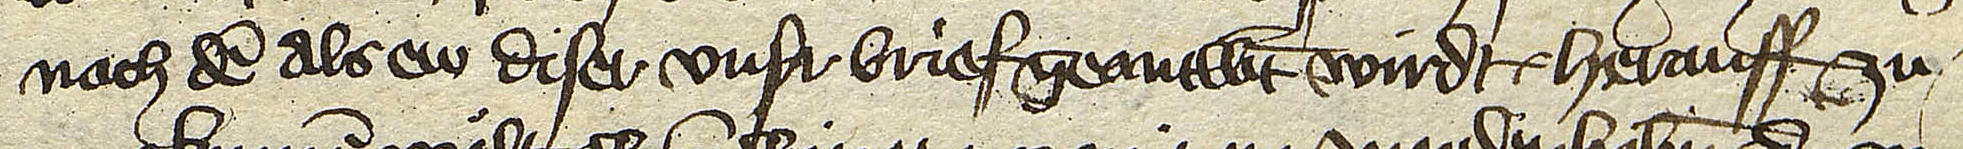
nach d* als ew diſer vnſ*r brief geantw*t wirdt / herauff cʒu
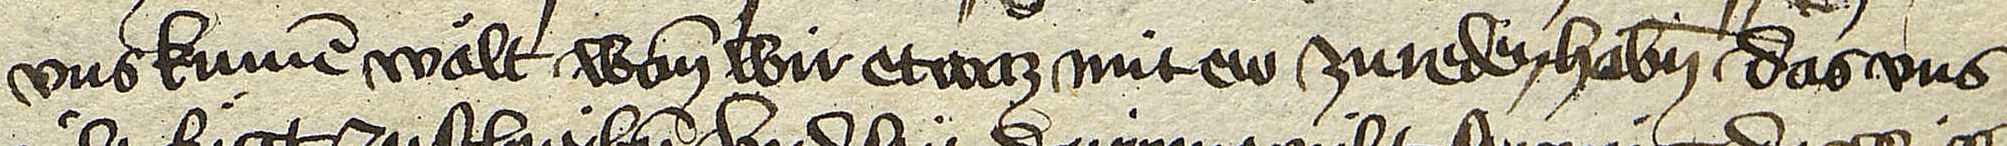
vns kume* wölt / wan* wir etwaʒ mit ew cʒureden habn* / das vns
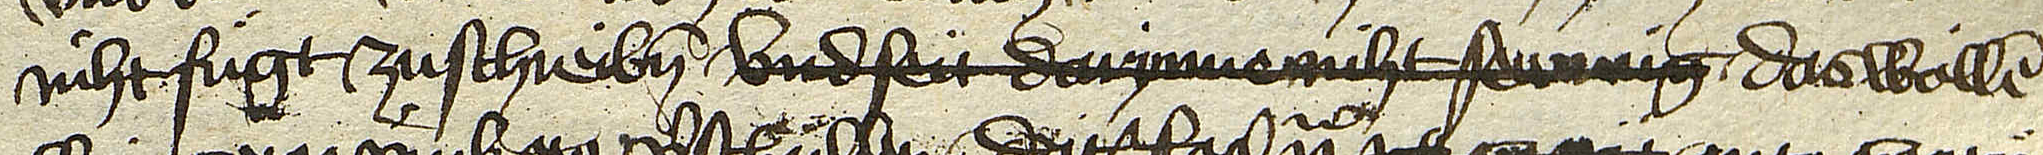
niht fügt cʒuſchreibn* / vnd ſeit darynne niht ſlewnig / das wölle*
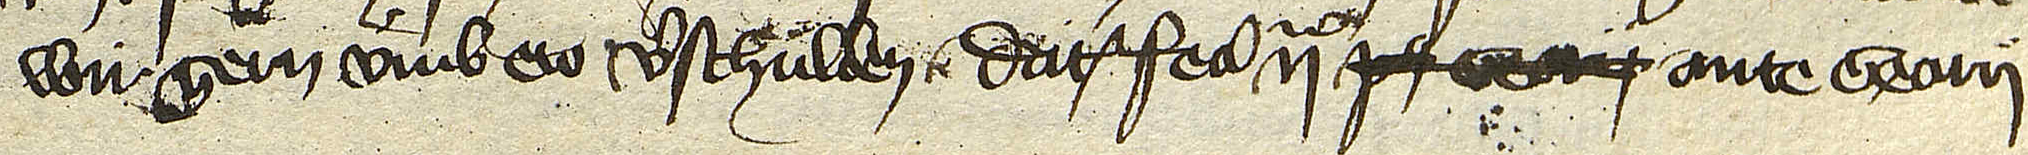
wir gern v̈mb ew v*ſchulden / dat* fea* ii* p* Georii* ante Georii*
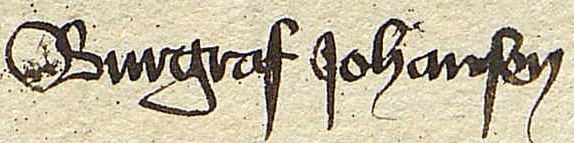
Burgraf Iohanſen
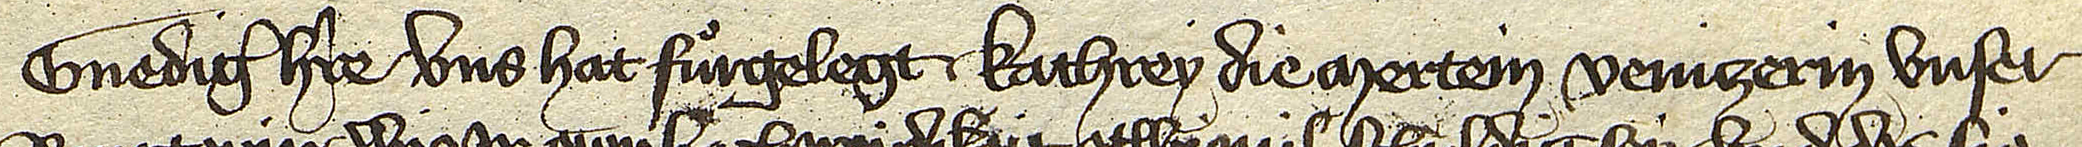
Gnedig* h*re / Vns hat fürgelegt / kathrein die Mertein venicʒerin vnſer
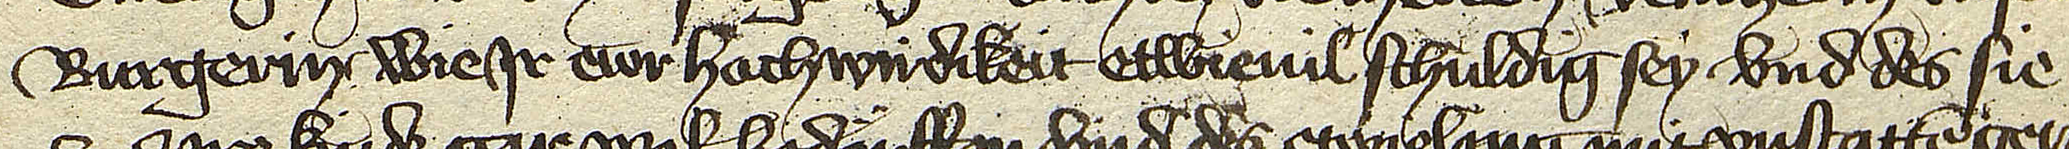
Burgerin / wie Ir ewr hochwirdikeit etwieuil ſchuldig ſey / vnd des ſie
